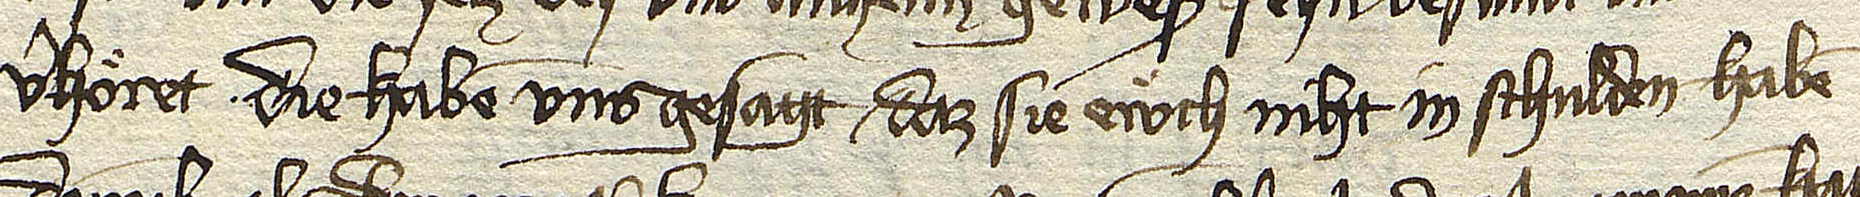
v*höret . Die habe* vns geſagt / daʒ ſie ewch niht in ſchulden habe*
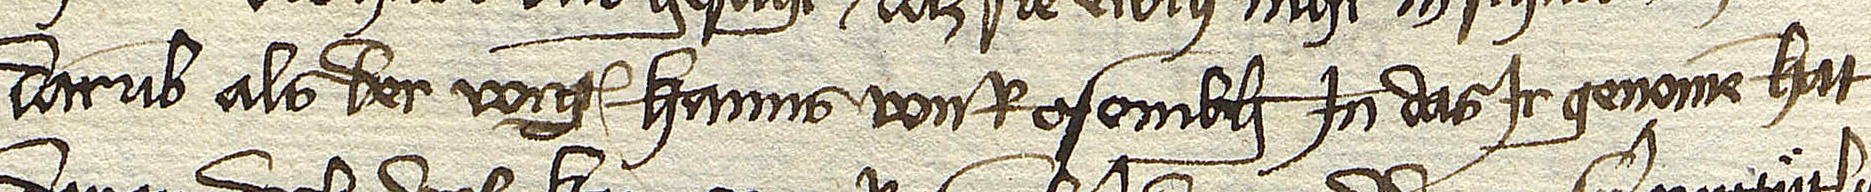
daru*b als der vorg* hanns von Roſemb*g In das Ir genome* hat
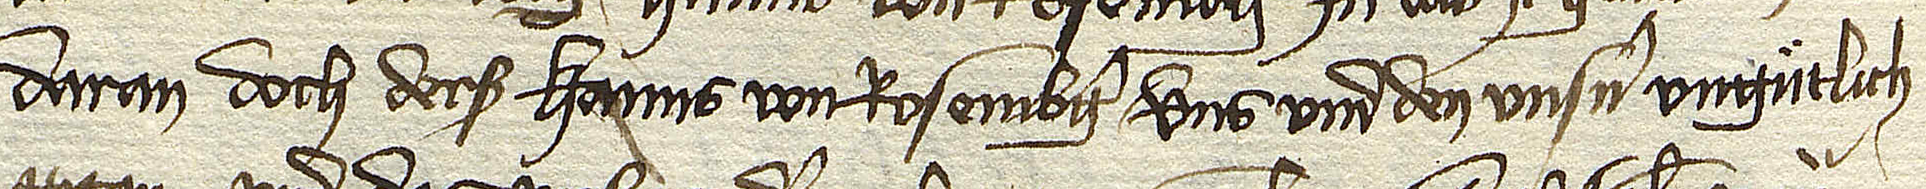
daran doch derſ* Hanns von Roſemb*g / Vns vnd den vnſ*n vngütlich
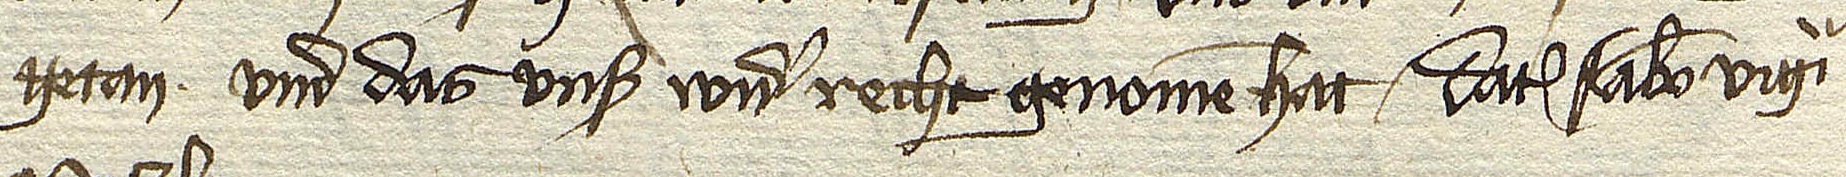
getan . vnd das vnſ* wid* recht genome* hat / Dat* ſabo vigi*
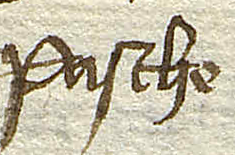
Paſche
